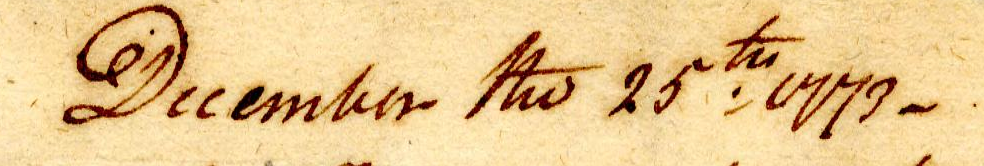December the 25^th 1773
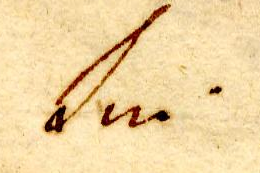Sir
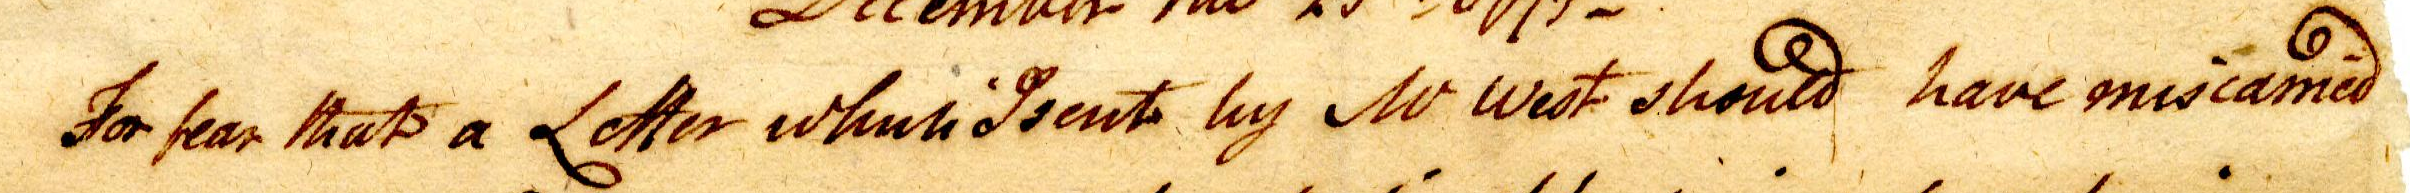For fear that a Letter which I sent by M^r West should have miscarried
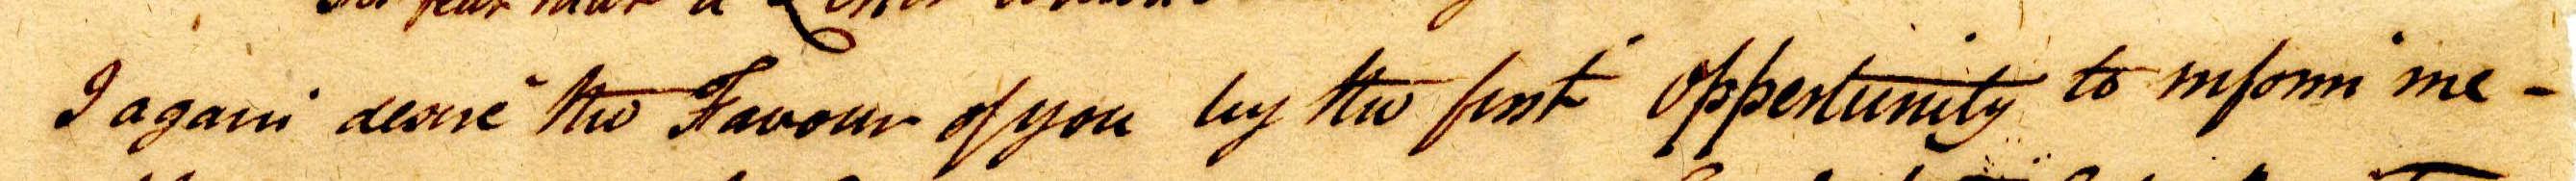I again desire the Favour of you by the first Oppertunity to inform me
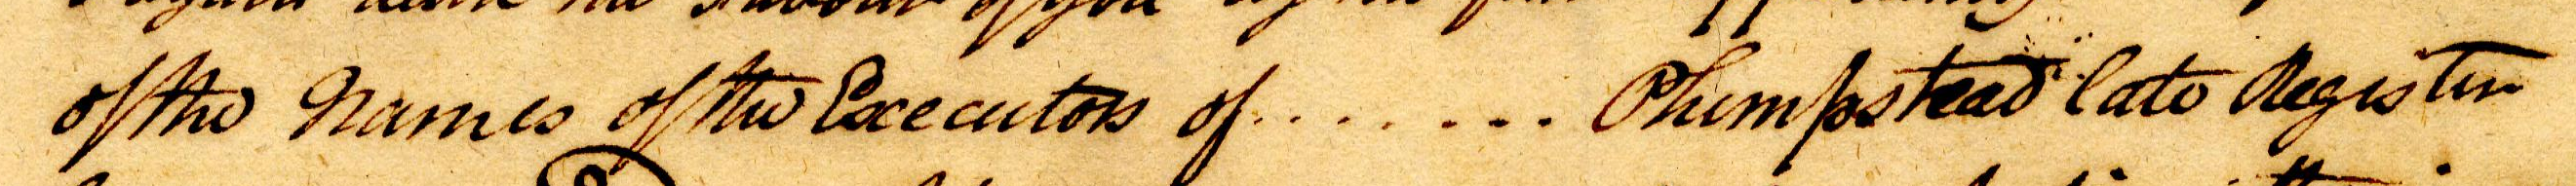of the names of the Executors of....... Plumpstead late Register
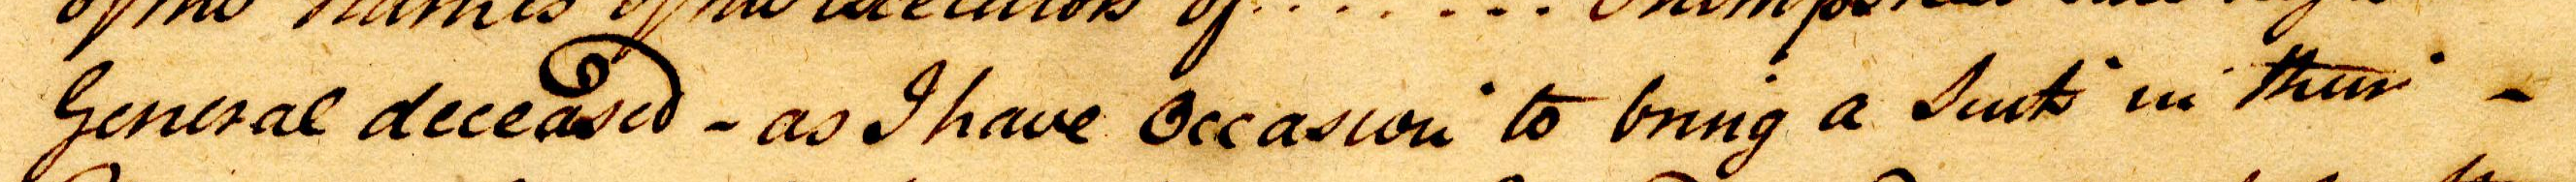General deceased. as I have Occasion to bring a Suit in their
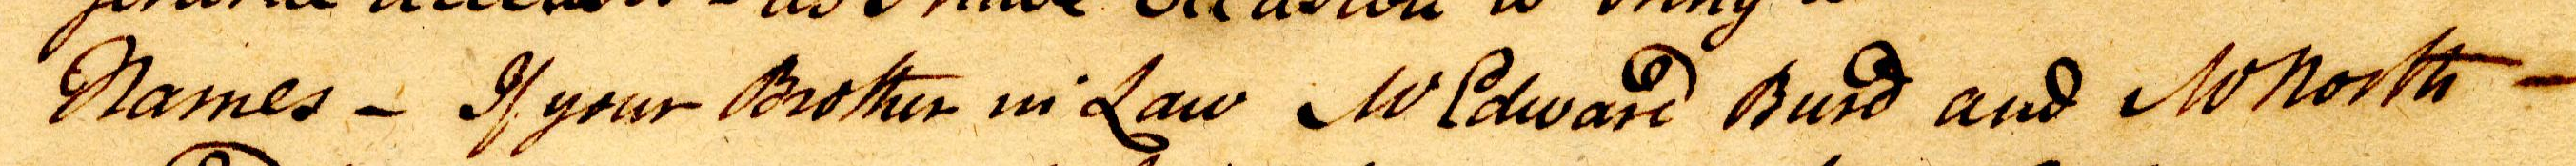Names. If your Brother in Law M^r Edward Burd and M^r North
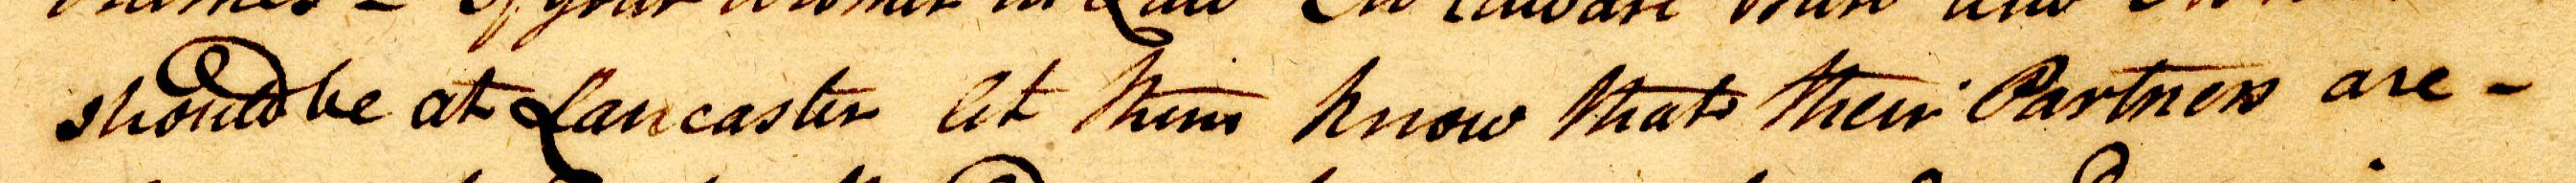should be at Lancaster let them know that their Partners are
